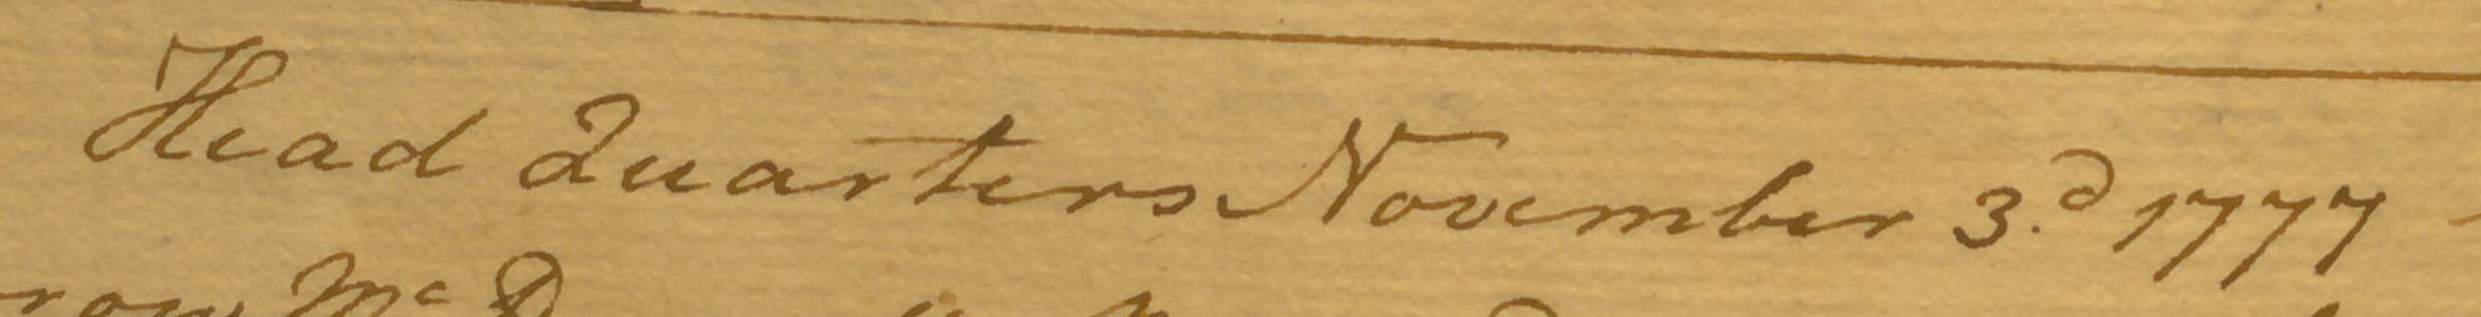Head Quarters November 3^d. 1777-
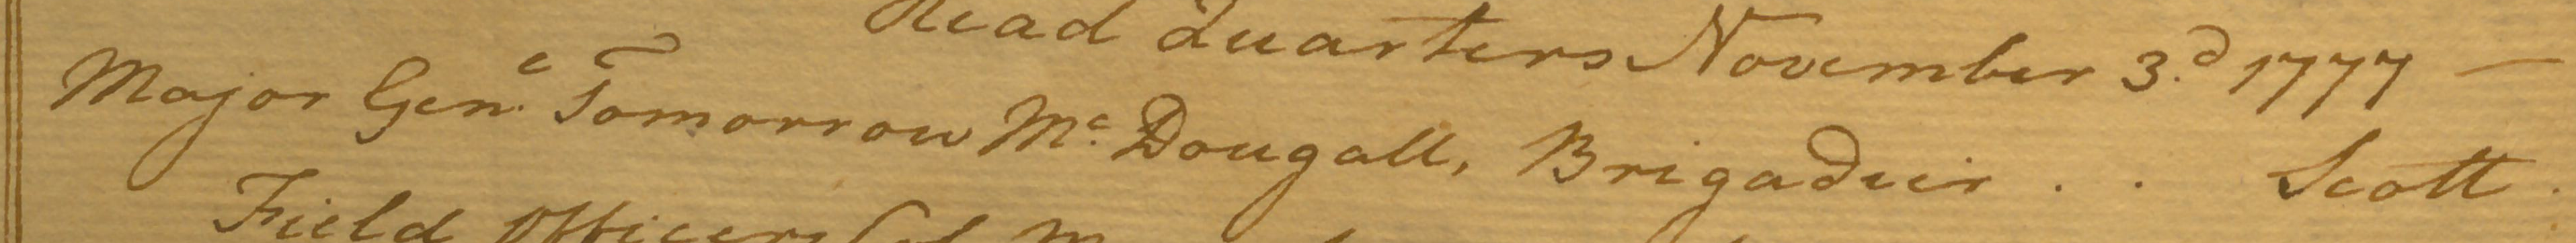Major Gen^l. Tomorrow M^c.Dougall, Brigadier .. Scott
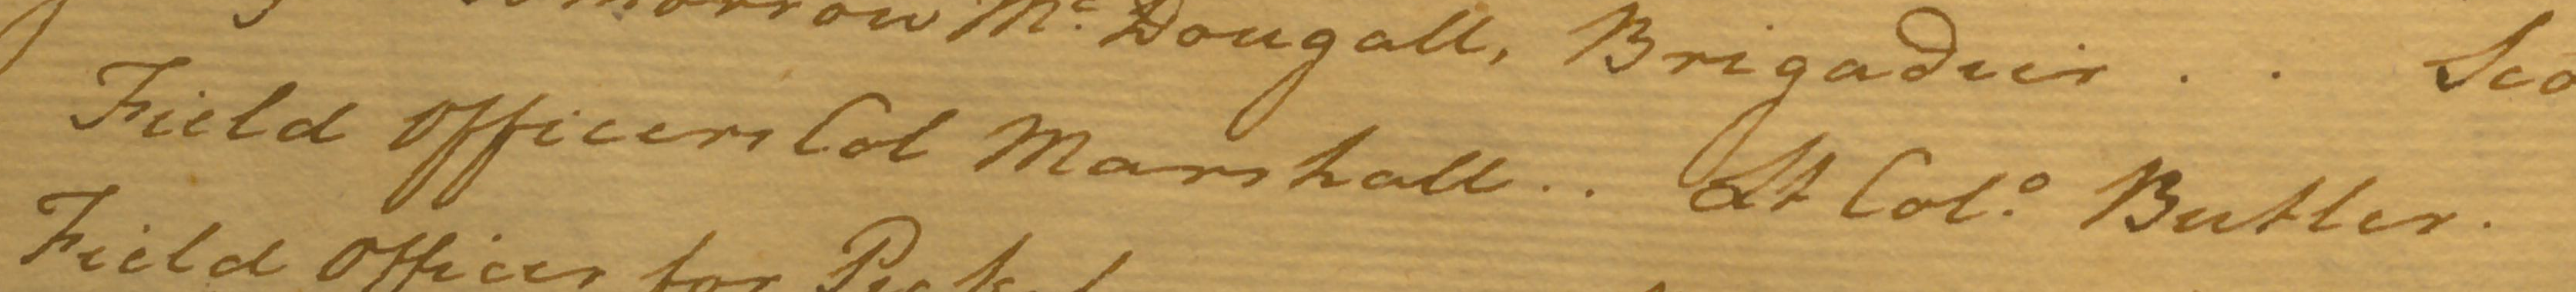Field Officers Col Marshall.. Lt Col^o. Butler.
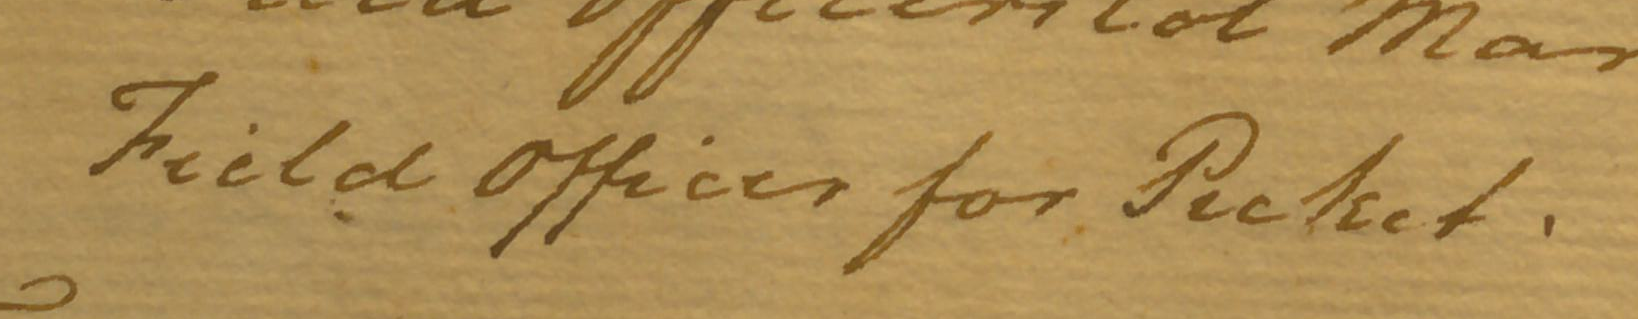Field officer for Picket.
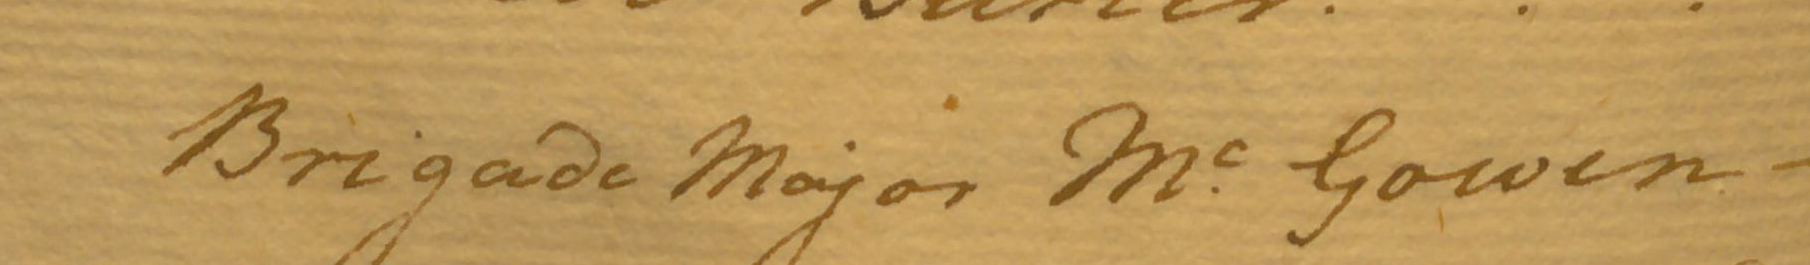Brigade Major M^c.Gowen-
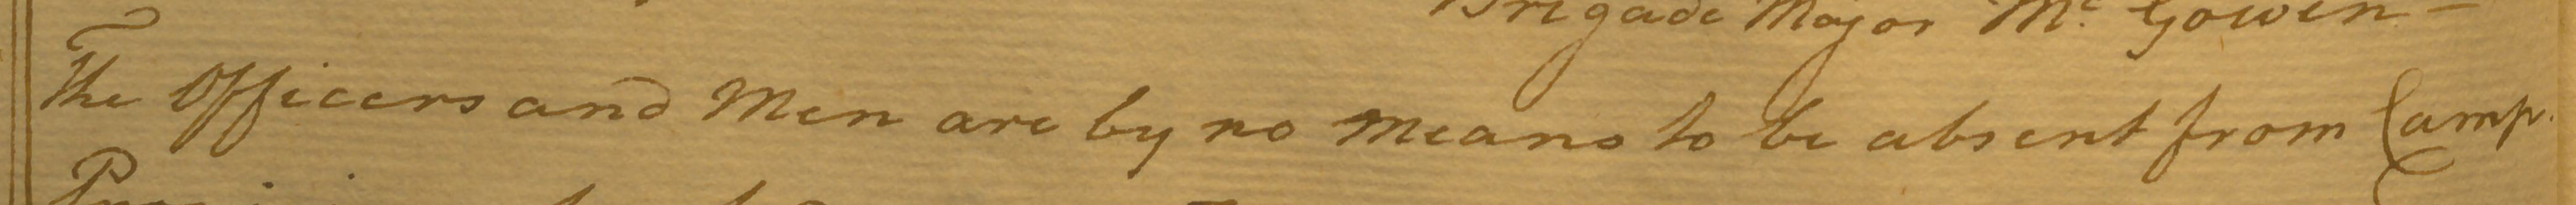The Officers and Men are by no means to be absent from Camp
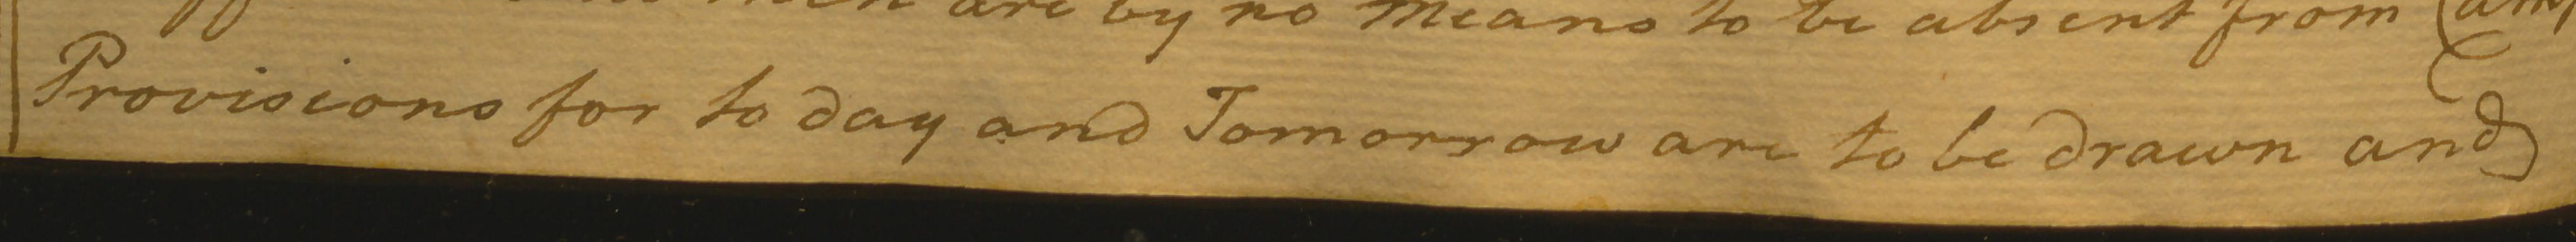Provisions for to day and Tomorrow are to be drawn and
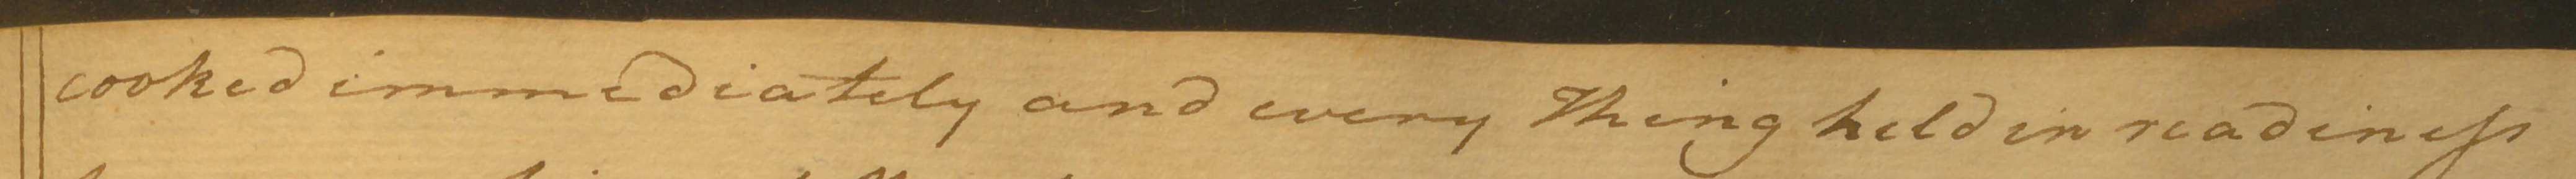cooked immediately and every Thing held in readiness
